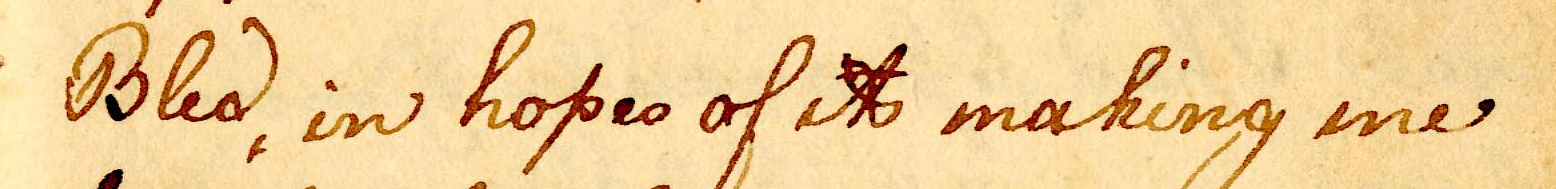Bled, in hopes of its making me
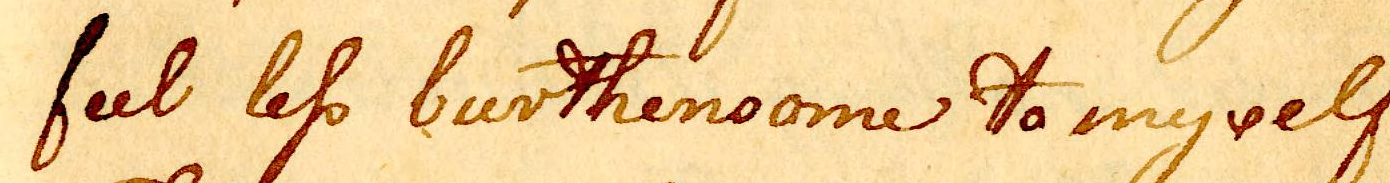feel less burthensome to myself
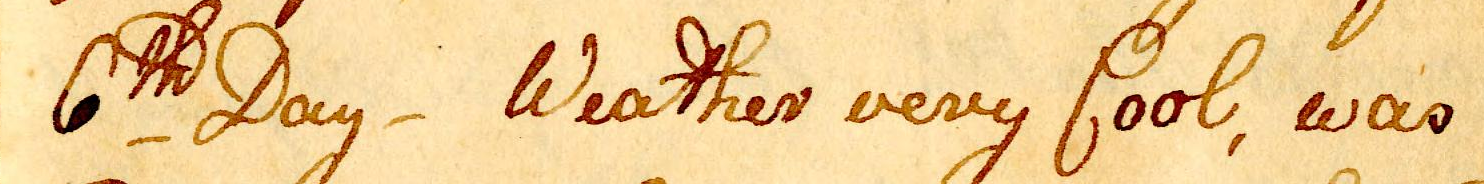6^th Day- Weather very Cool, was
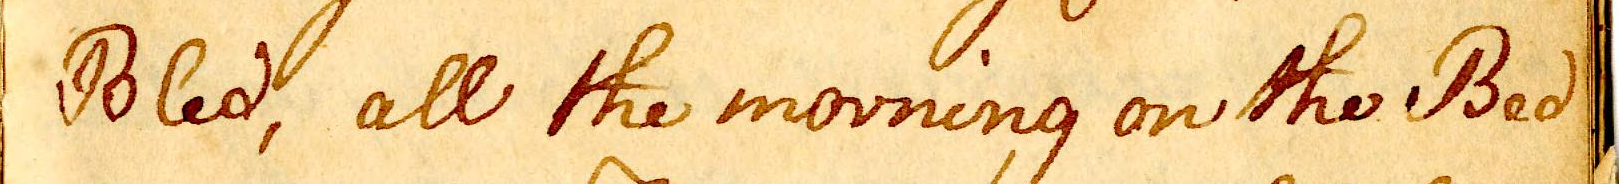Bled, all the morning on the Bed
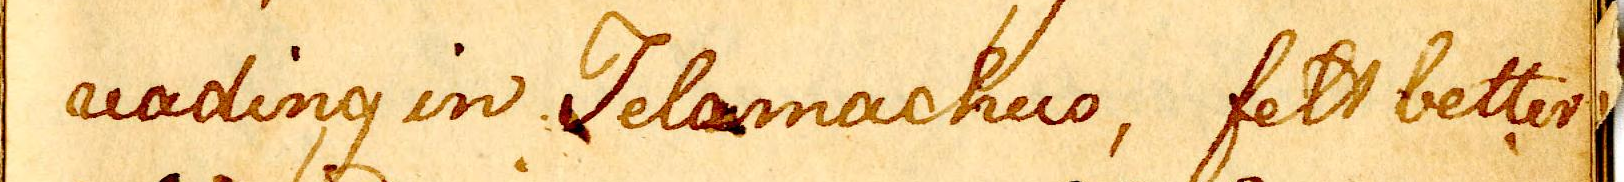reading in Telamachus, felt better
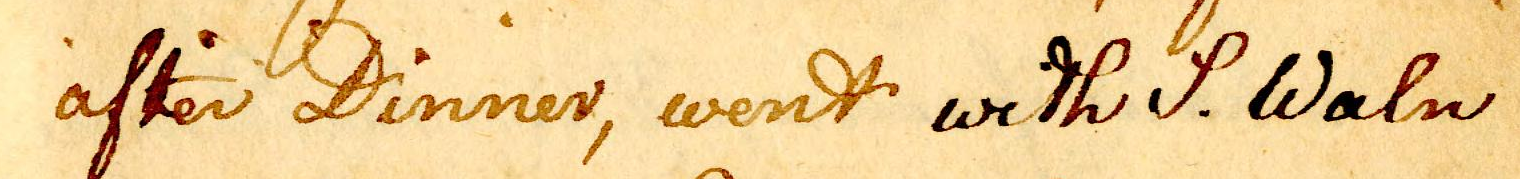after Dinner, went with S. Waln
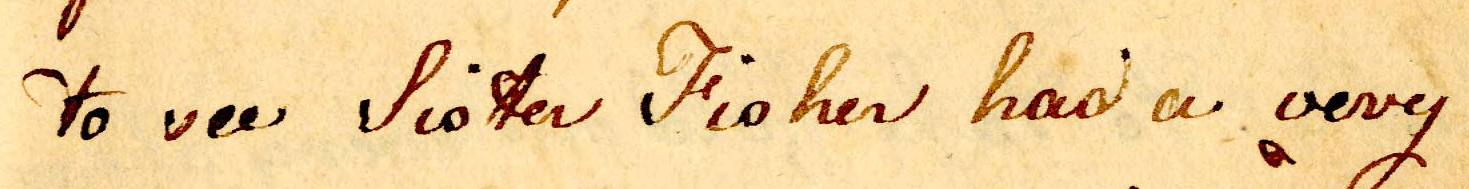to see Sister Fisher had a very
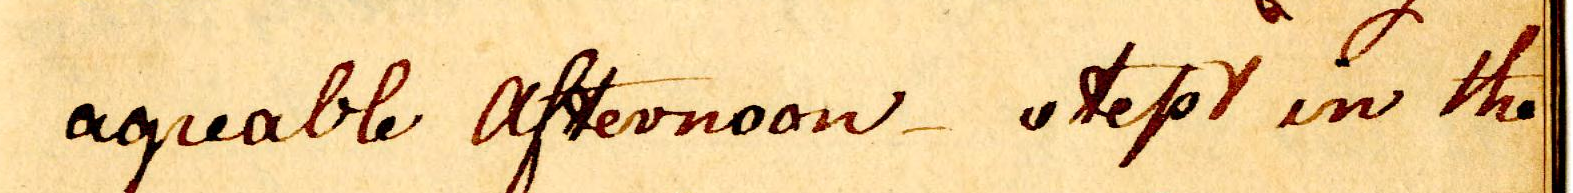agreable Afternoon- stept in the
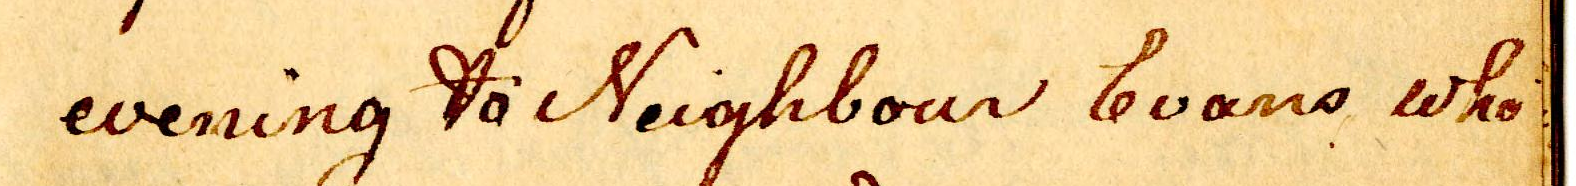evening to Neighbour Evans who
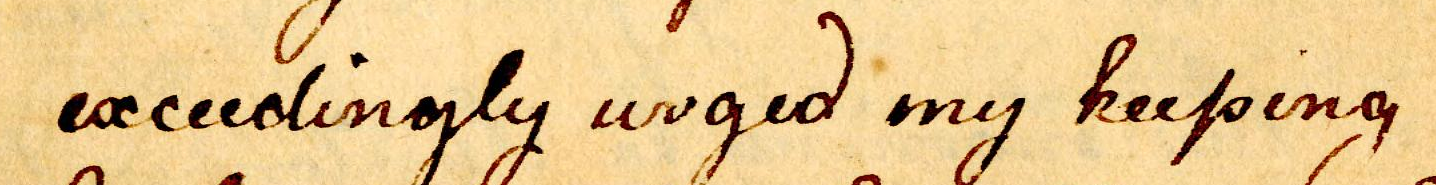exceedingly urged my keeping
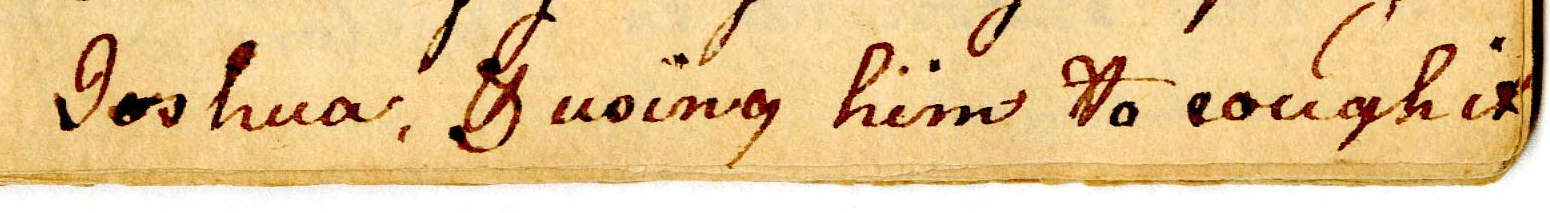Joshua, & using him to rough it
